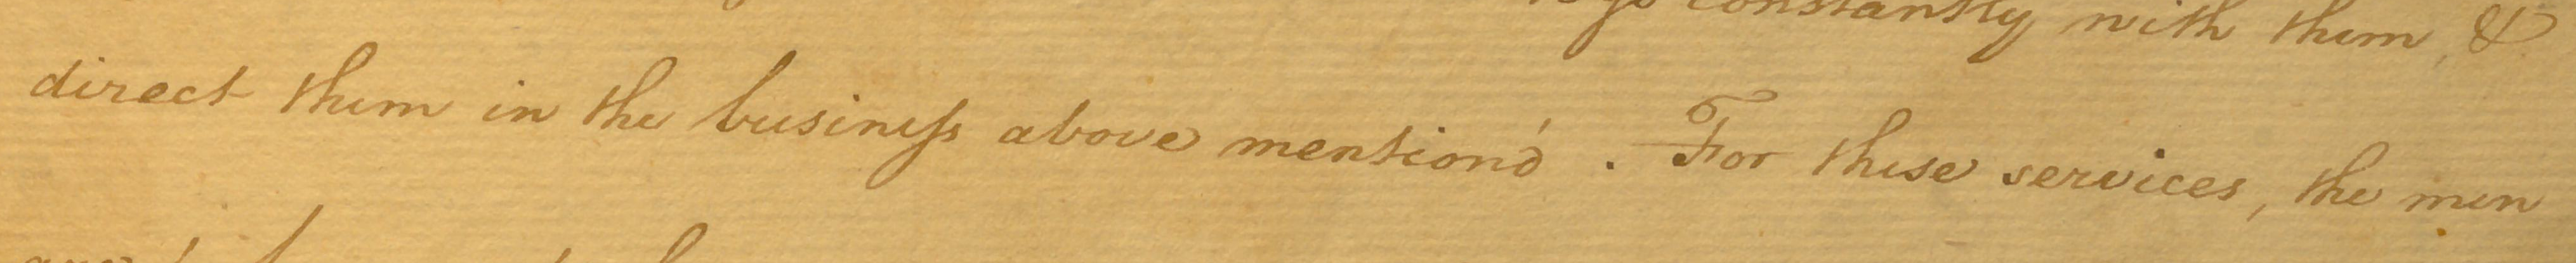direct them in the business above mention'd. For those services, the men
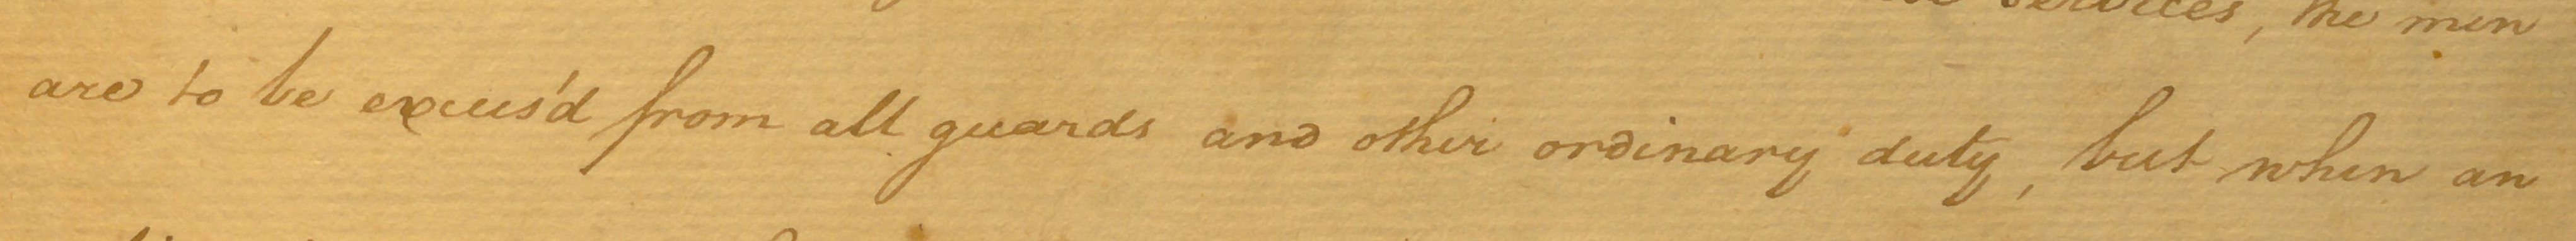are to be excus'd from all guards and other ordinary duty, but when an
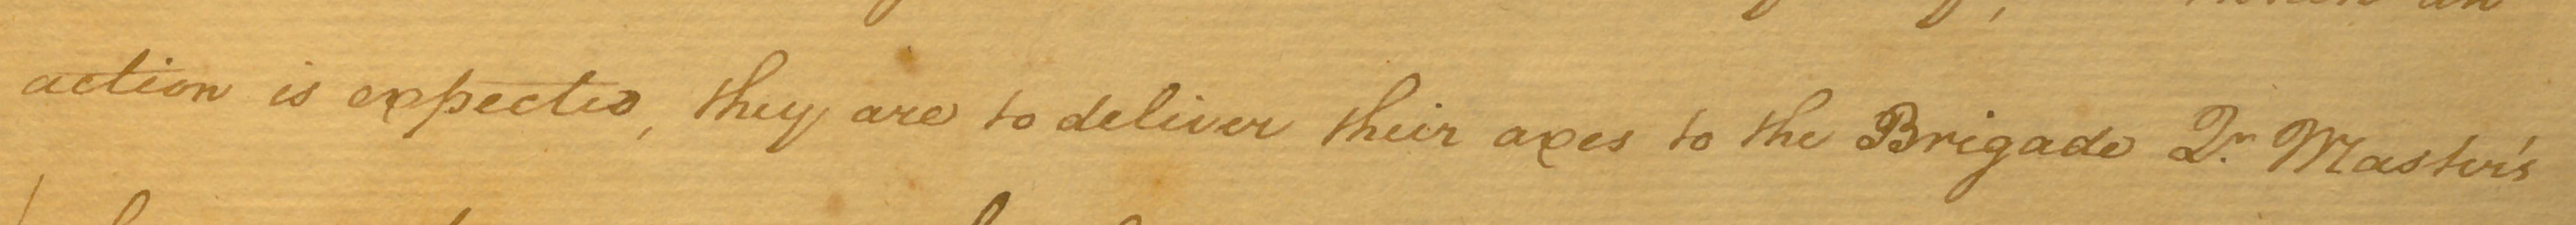action is expected, they are to deliver their axes to the Brigade Q^r. Master's
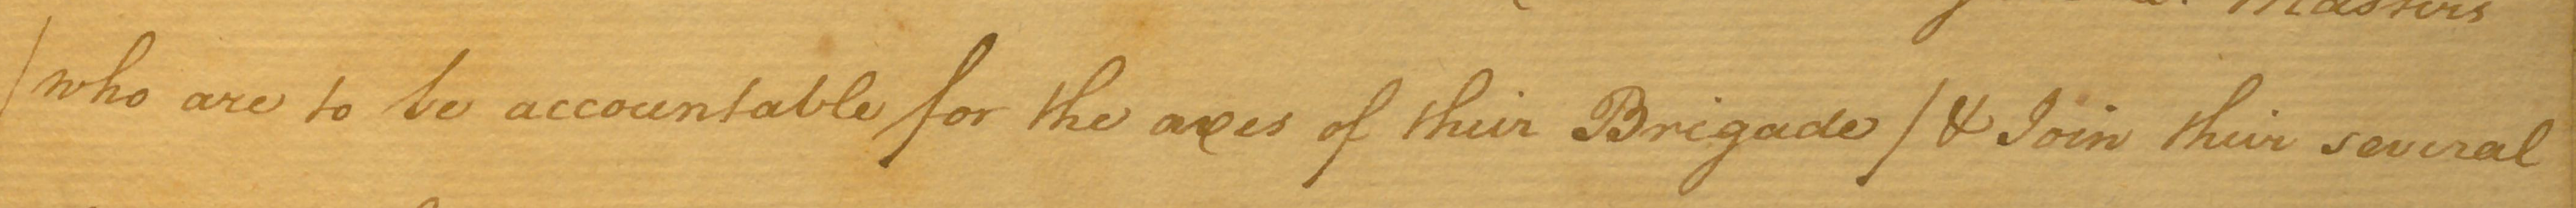/who are to be accountable for the axes of their Brigade/ & Join their several
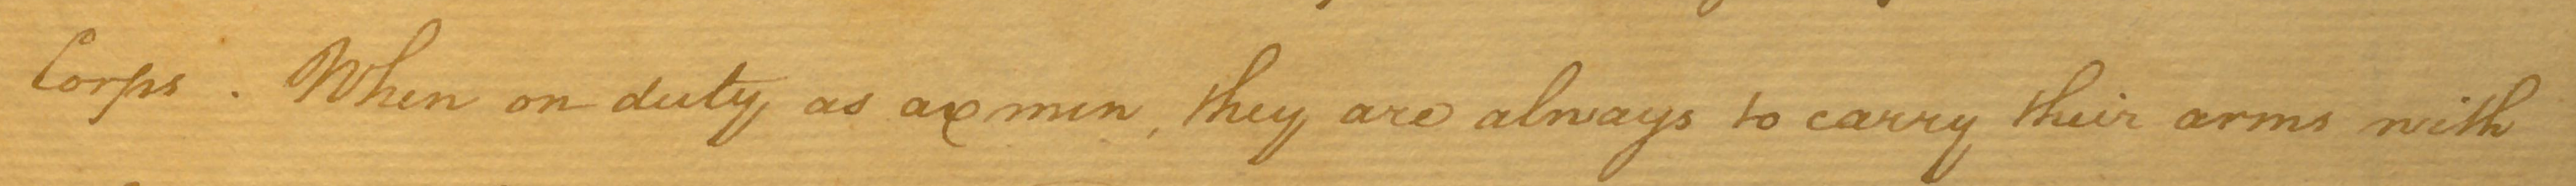Corps. When on duty as axmen, they are always to carry their arms with
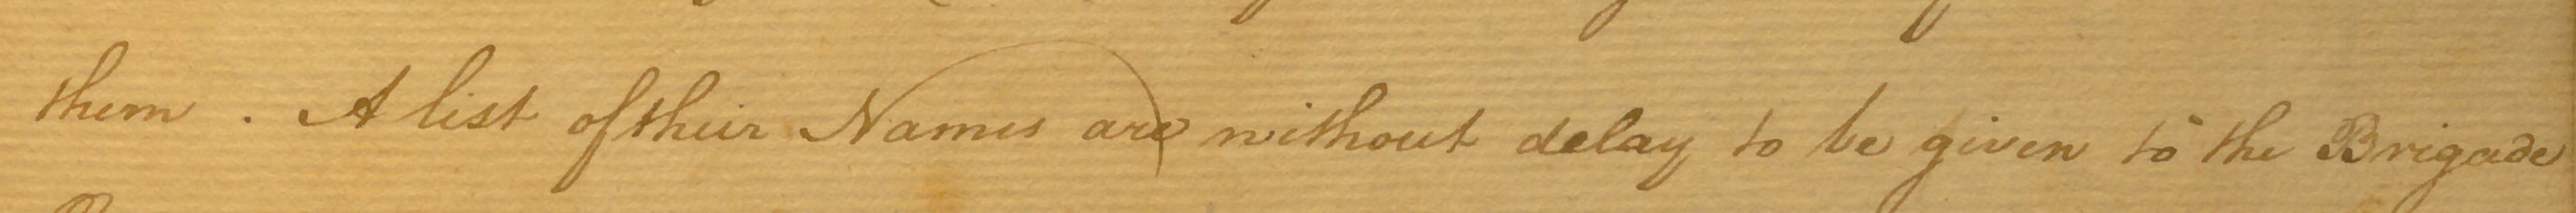them. A list of their Names are without delay to be given to the Brigade
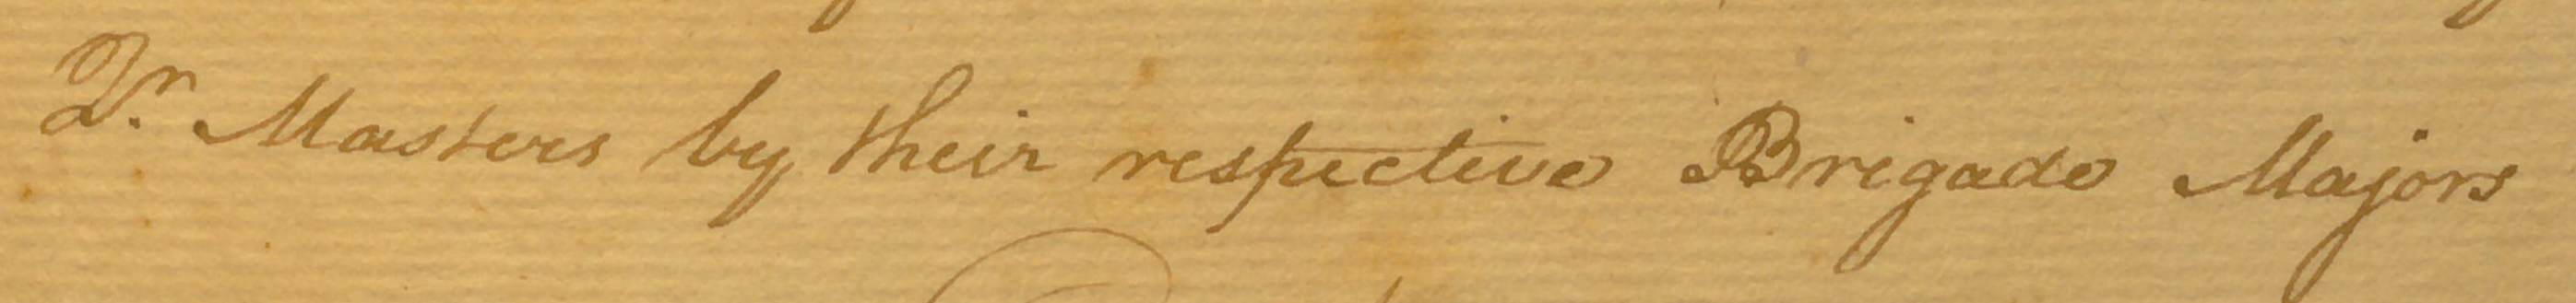Q^r. Masters by their respective Brigade Majors
